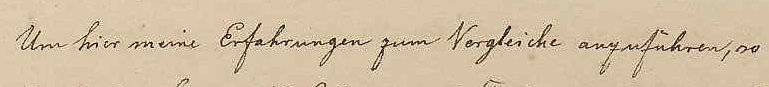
Um hier meine Erfahrungen zum Vergleiche anzuführen, so
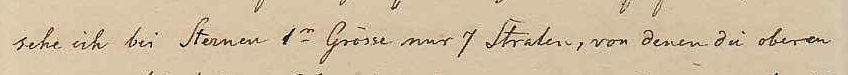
sehe ich bei Sternen 1￼ Grösse nur 7 Stralen, von denen die oberen
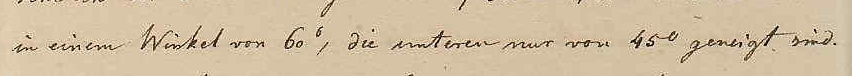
in einem Winkel von 60°, die unteren nur von 45° geneigt sind.
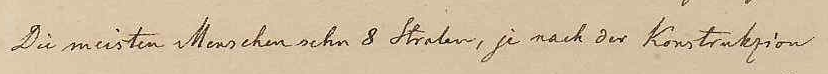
Die meisten Menschen sehn 8 Stralen, je nach der Konstrukzion
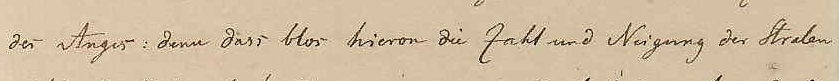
des Auges: denn dass blos hievon die Zahl und Neigung der Stralen
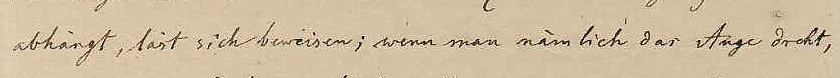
abhängt, läst sich beweisen; wenn man nämlich das Auge dreht,
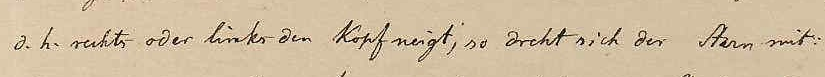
d. h. rechts oder links den Kopf neigt, so dreht sich der Stern mit:
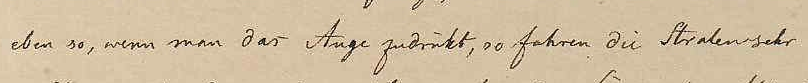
eben so, wenn man das Auge zudrükt, so fahren die Stralen sehr
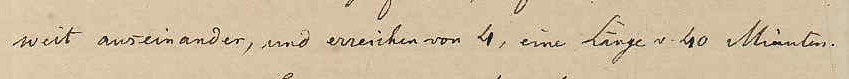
weit auseinander, und erreichen von 4, eine Länge v. 40 Minuten.
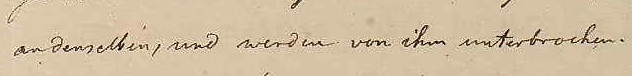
an denselben, und werden von ihm unterbrochen.
